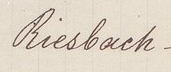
Riesbach –
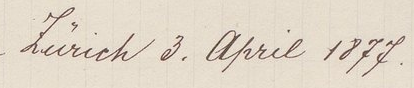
Zürich3. April 1877.
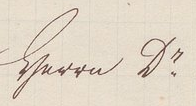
Herrn Dr
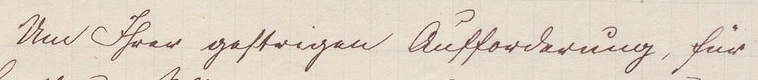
Um Ihrer gestrigen Aufforderung, für
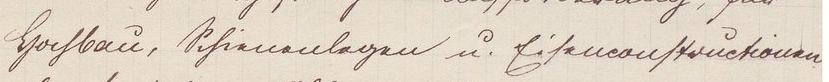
Hochbau, Schienenlegen u. Eisenconstructionen
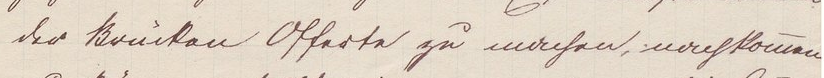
der Brücken Offerte zu machen, nachkommen
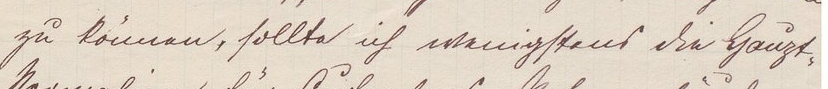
zu können, sollte ich wenigstens die Haupt-
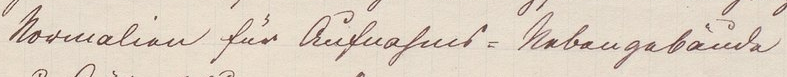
Normalien für Aufnahms-Nebengebäude
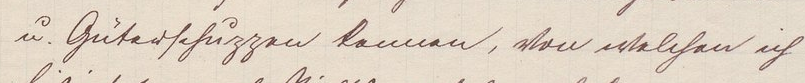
u. Güterschuppen kennen, von welchen ich
